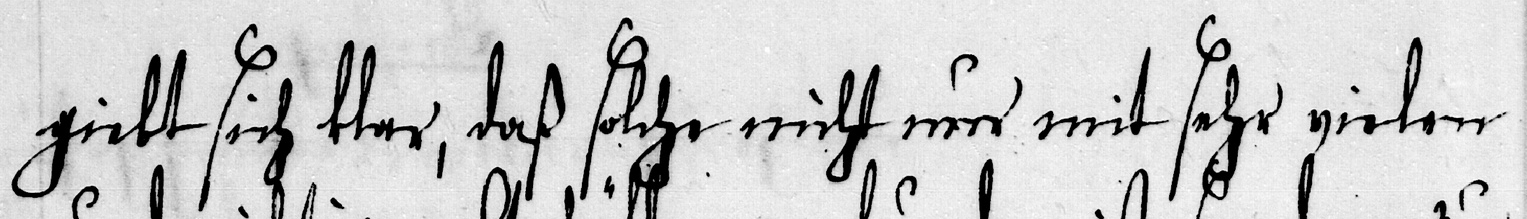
gibt sich klar, daß solche nicht nur mit sehr vielen
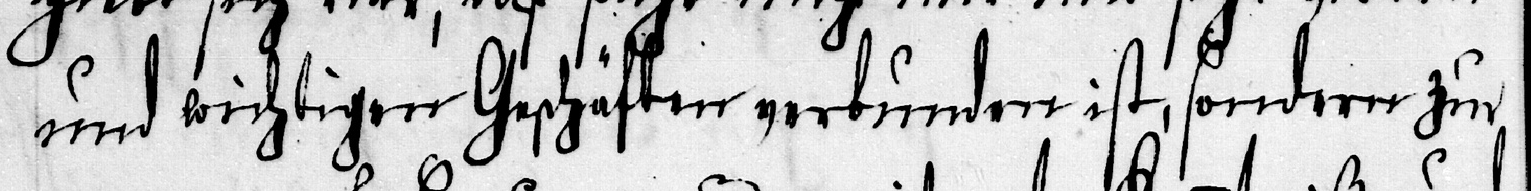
und wichtigen Geschäften verbunden ist, sondern zur
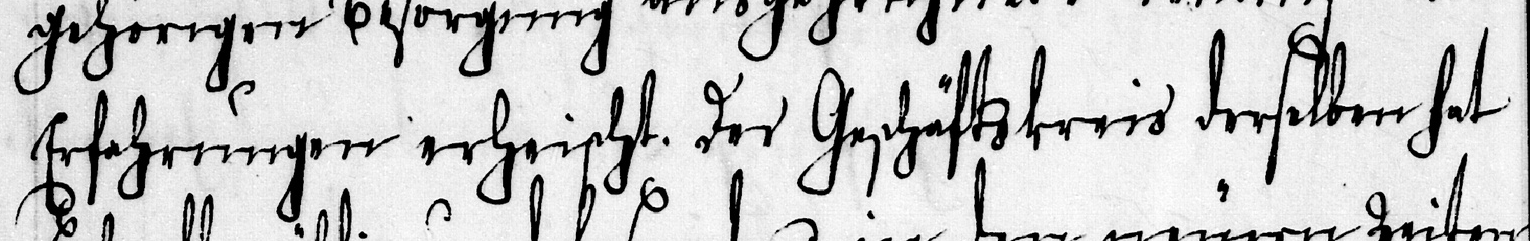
Erfahrungen erheischt. Der Geschäftskreis derselben hat
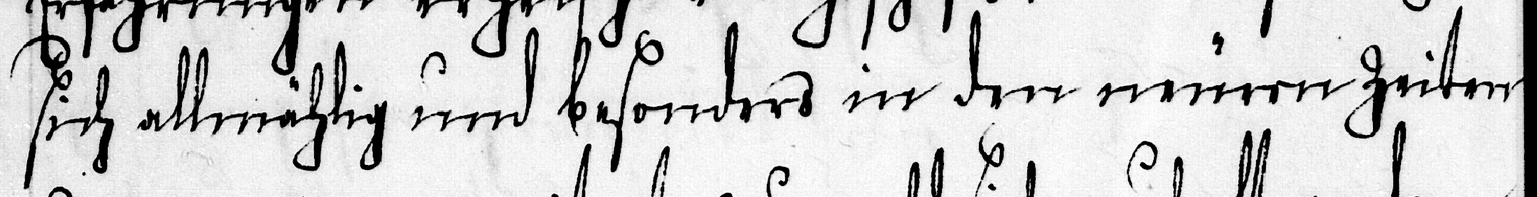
sich allmählig und besonders in den neuern Zeiten
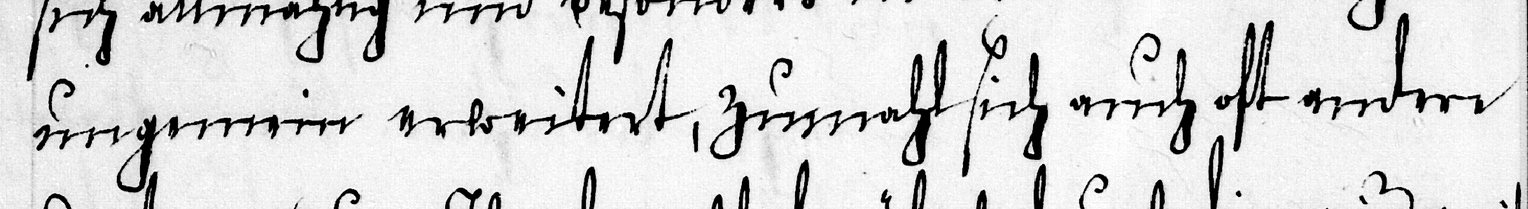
ungemein erweitert, zumahl sich auch oft andere
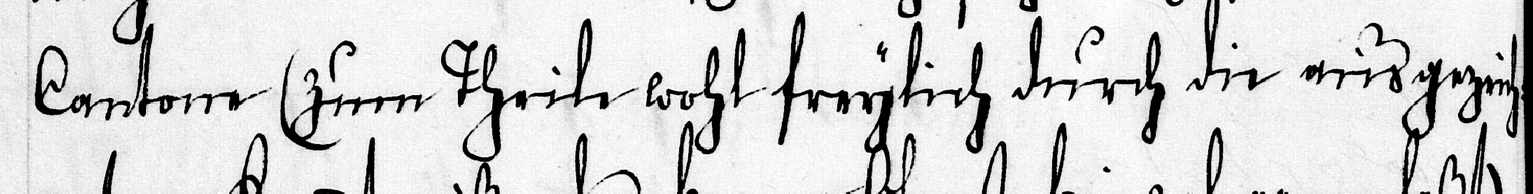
Cantone (zum Theile wohl freylich durch die ausgezei¬
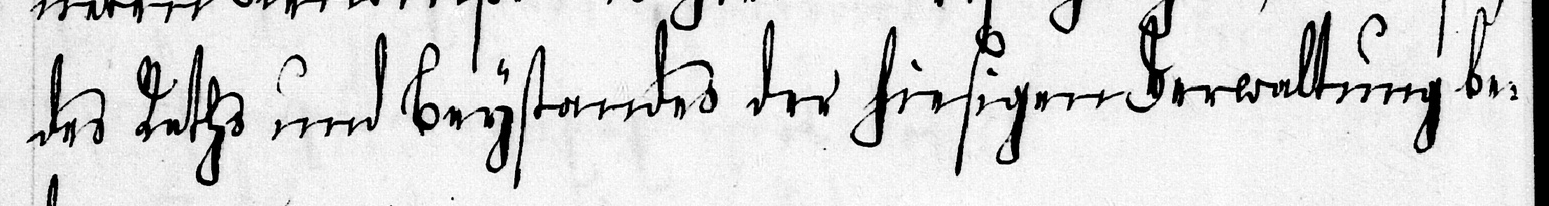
des Rathes und Beystandes der hiesigen Verwaltung be¬
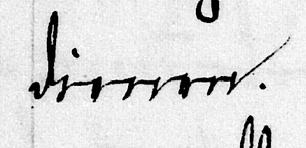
dienen.
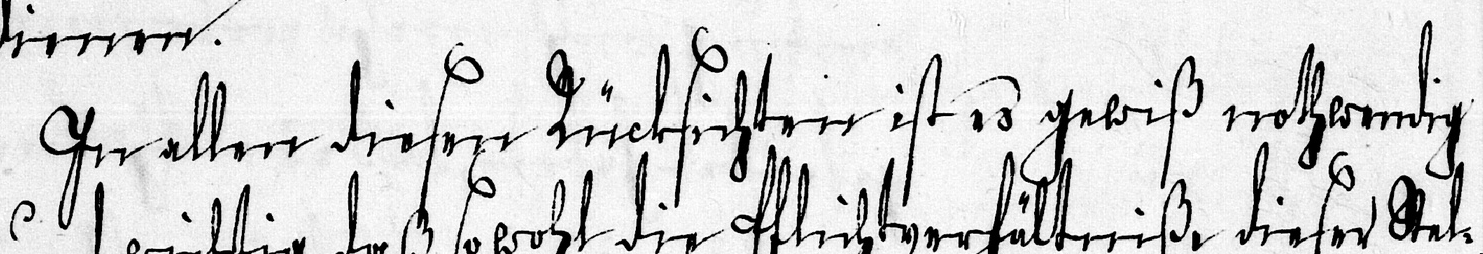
In allen diesen Rücksichten ist es gewiß nothwendig
